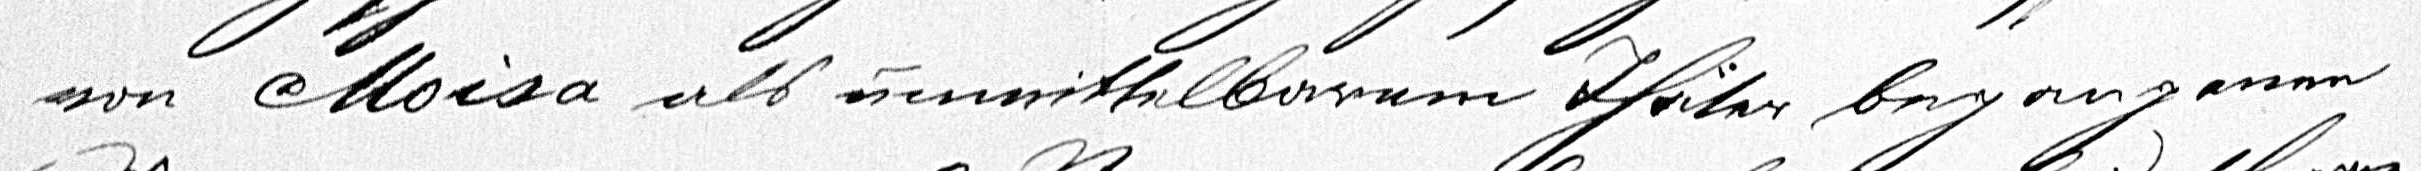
von Moisa als unmittelbaren Thäter begangenen
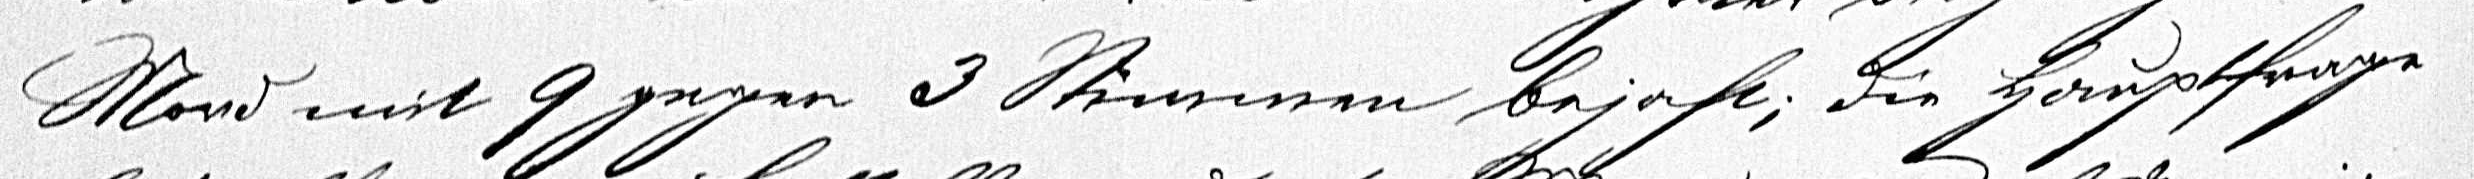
Mord mit 9 gegen 3 Stimmen bejaht; die Hauptfrage
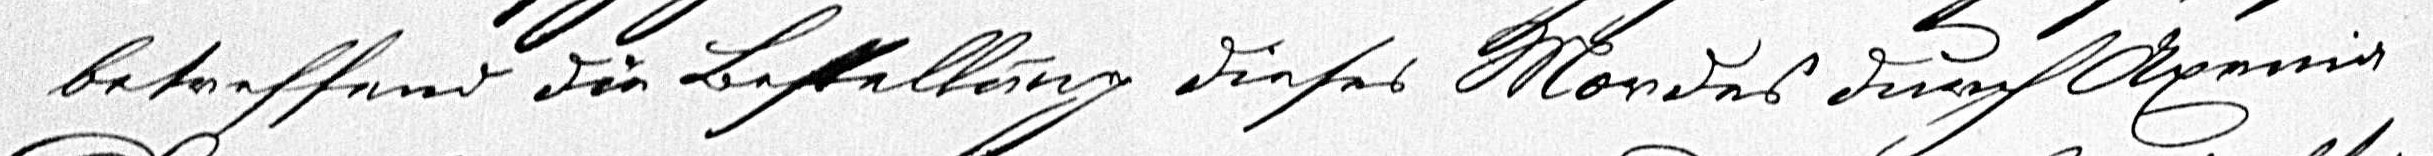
betreffend die Bestellung dieses Mordes durch Axenia
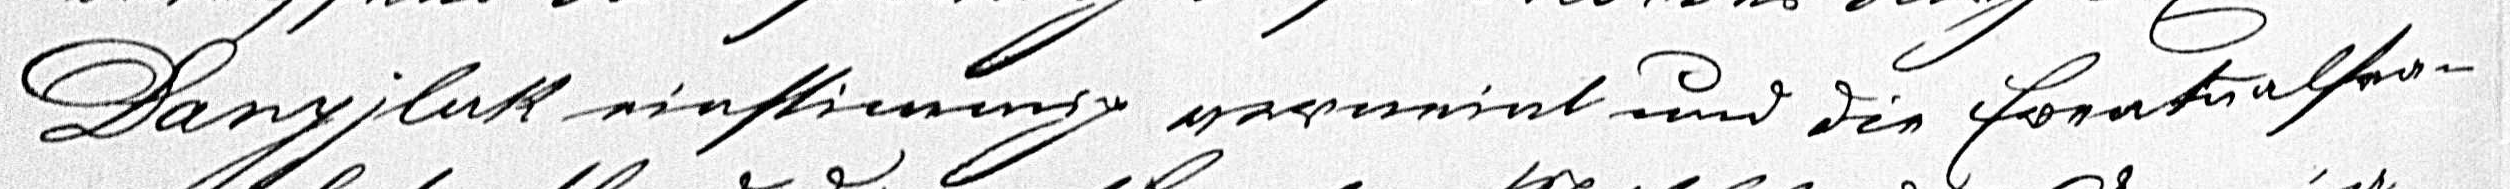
Danyjluk einstimmig verneint und die Eventualfra¬
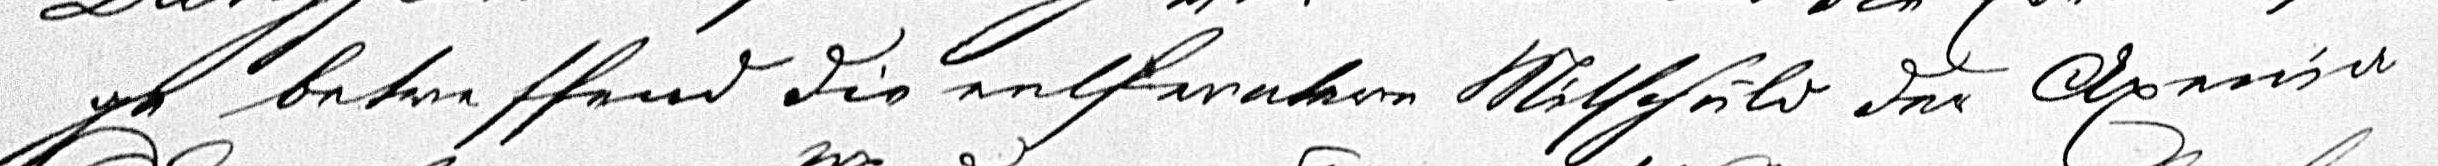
ge betreffend die entferntere Mitschuld der Axenia
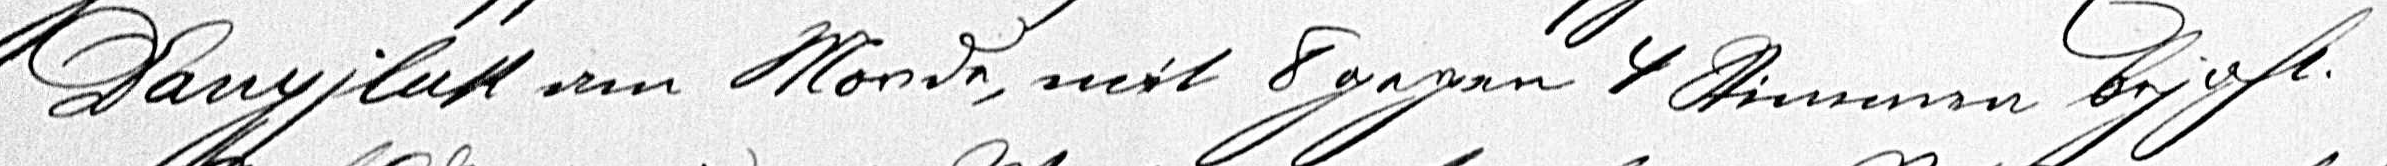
Danyjluk am Morde, mit 8 gegen 4 Stimmen bejaht.
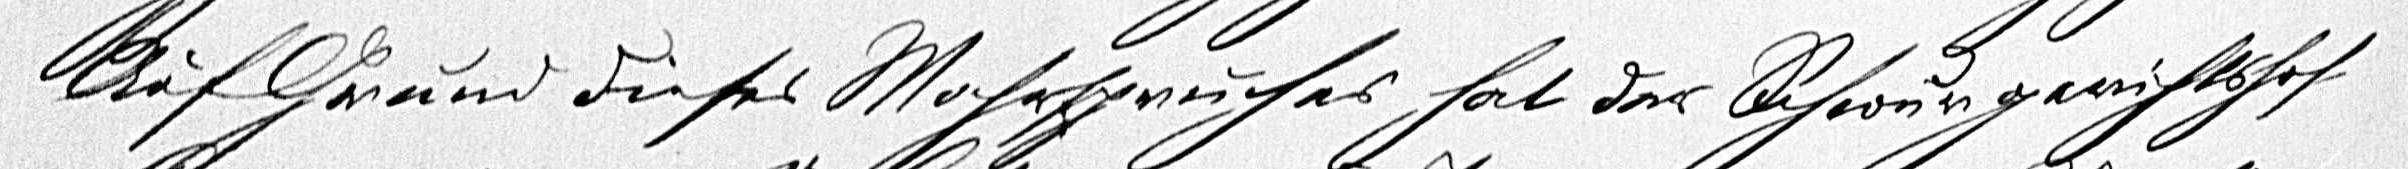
Auf Grund dieses Wahrspruches hat der Schwurgerichtshof
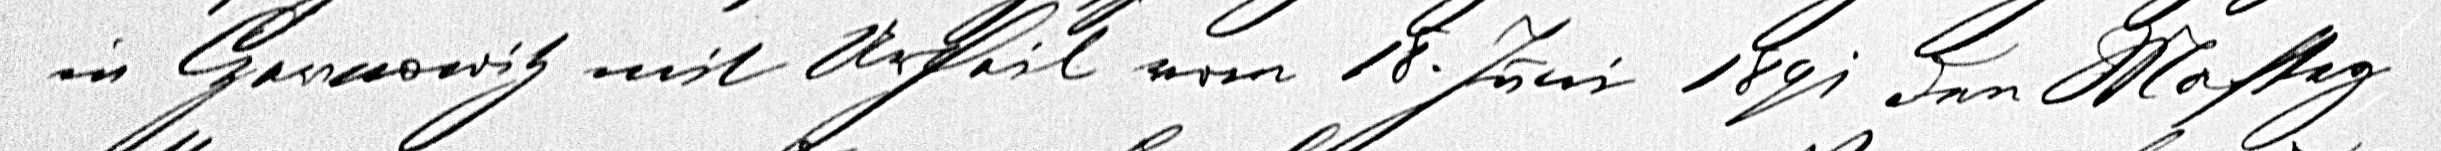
in Czernowitz mit Urtheil vom 18. Juni 1891 den Maftey
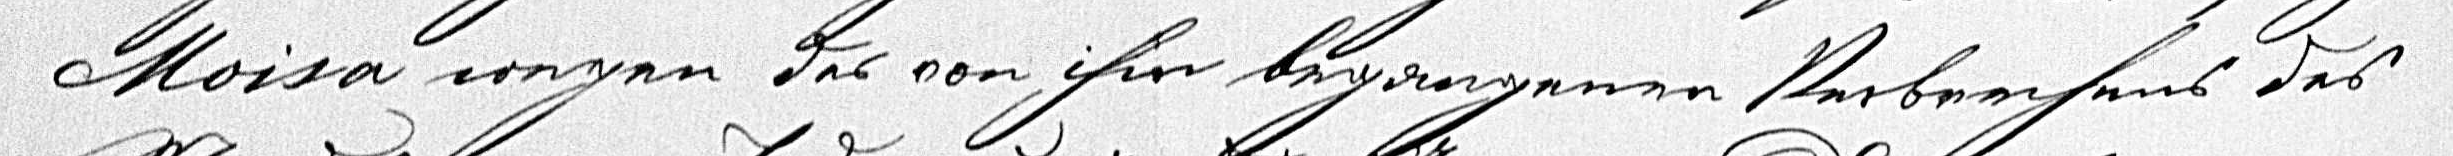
Moisa wegen des von ihm begangenen Verbrechens des
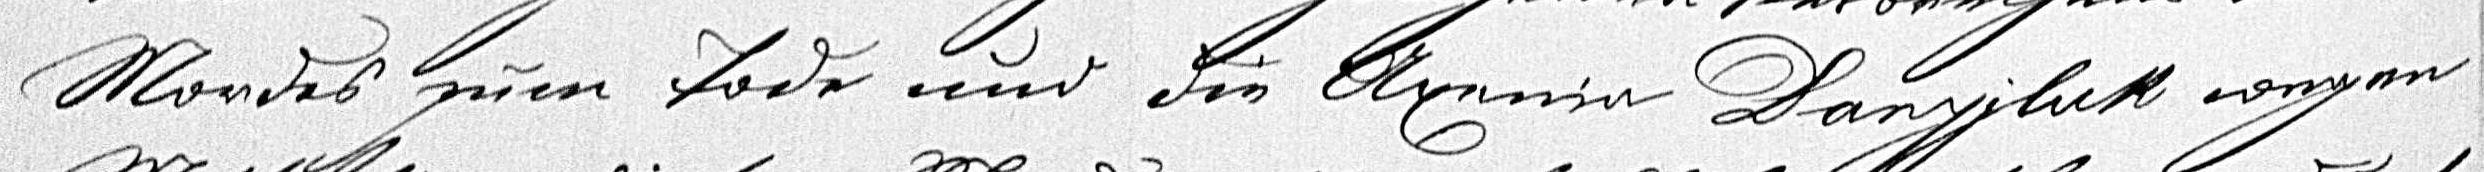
Mordes zum Tode und die Axenia Danyjluk wegen
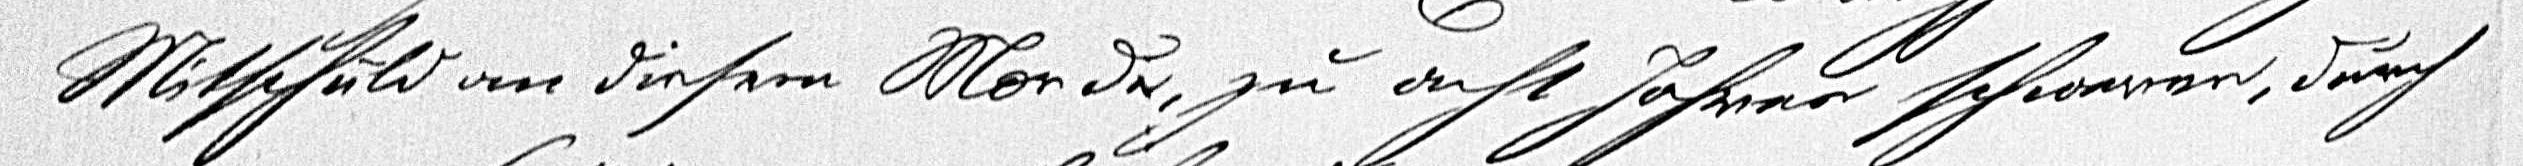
Mitschuld an diesem Morde, zu acht Jahren schweren, durch
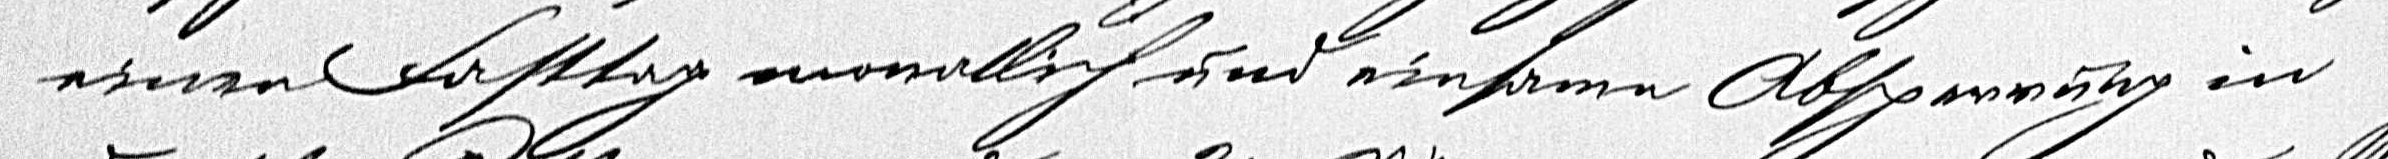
einen Fasttag monatlich und einsame Absperrung in
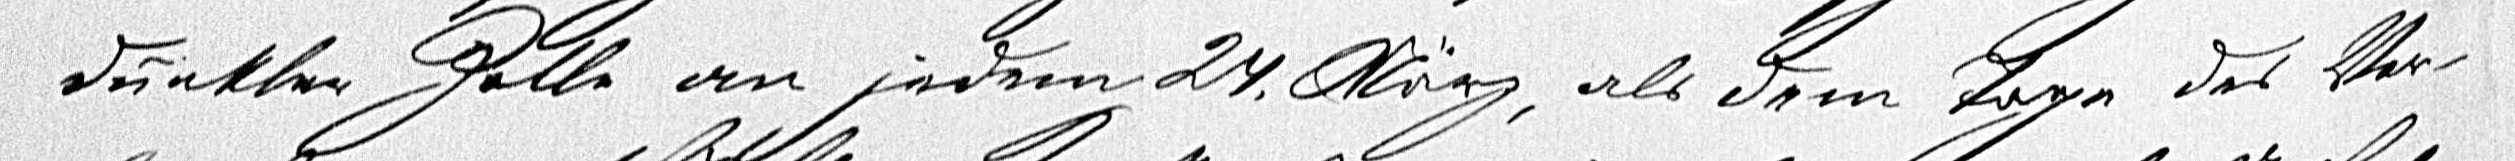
dunkler Zelle an jedem 24. März, als dem Tage des Ver¬
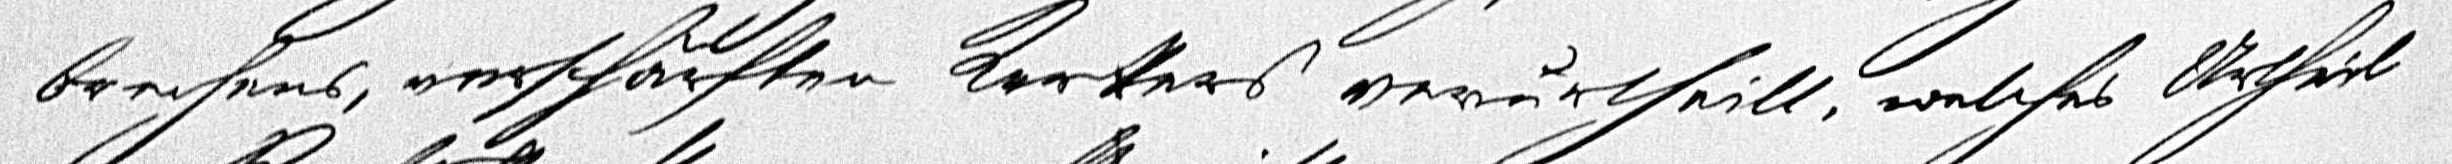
brechens, verschärften Kerkers verurtheilt, welches Urtheil
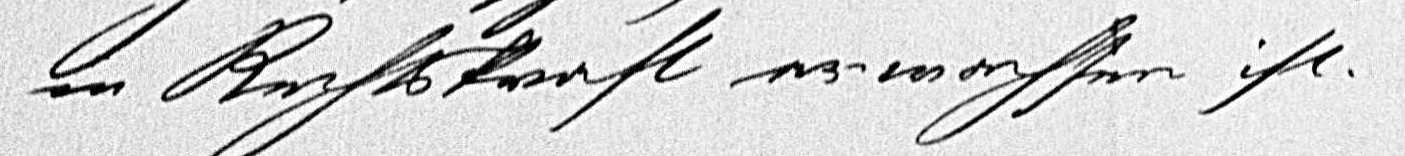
in Rechtskraft erwachsen ist.
